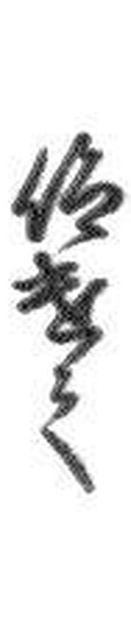仰遣之

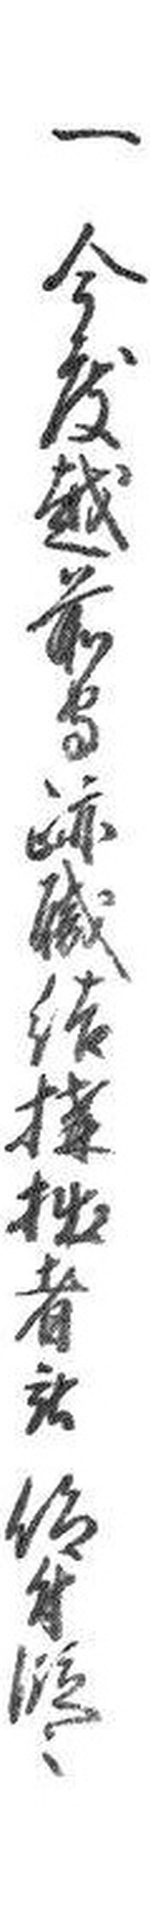一今度越前守跡式職結構拙者被仰付段々
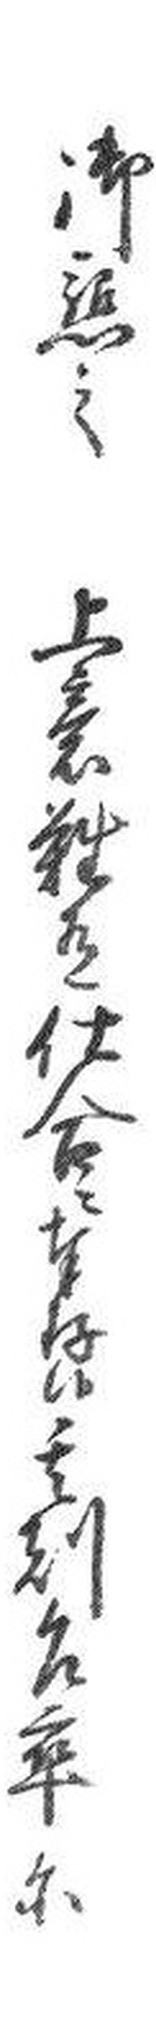御懇之上意難有仕合ニ奉存候其刻乍卒爾
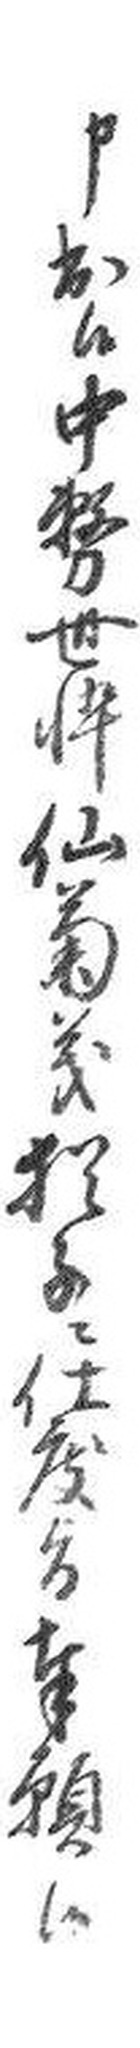申出候中務世忰仙菊義猶子ニ仕度旨奉願候
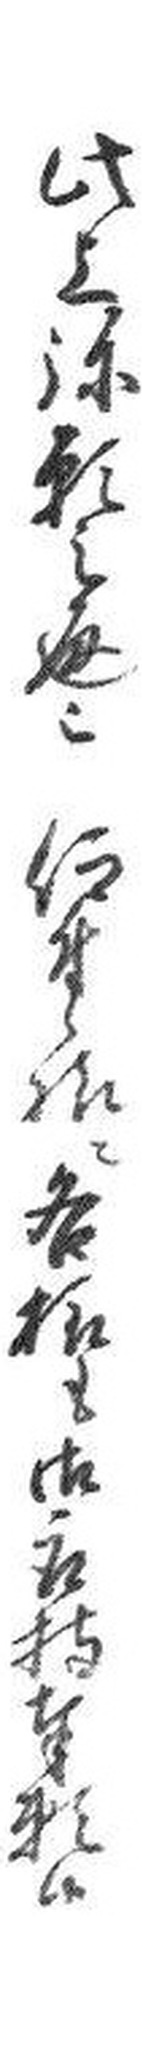此上弥願之通被仰付候様ニ各様も御取持奉願候
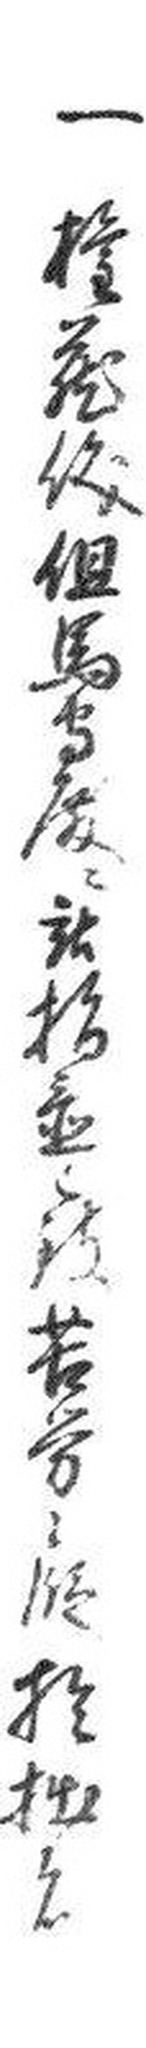一権蔵儀但馬守殿ニ被指置被致苦労候段於拙者
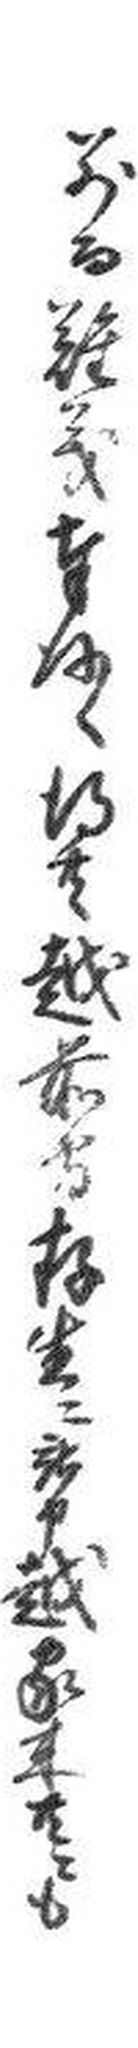別而難義奉存候得共越前守存生ニ被申越家来共ニも
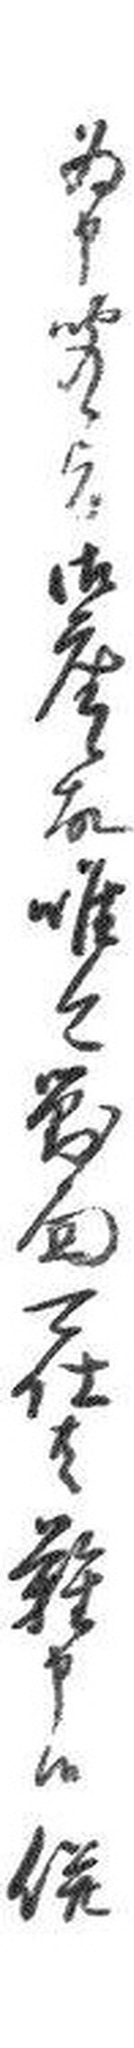為申聞候旨御座候故唯今対面可仕共難申候併
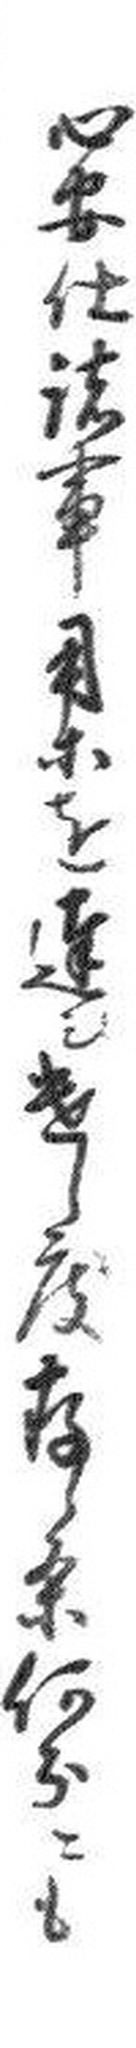心安仕諸事用等を達シ遣し度存候条何分ニも
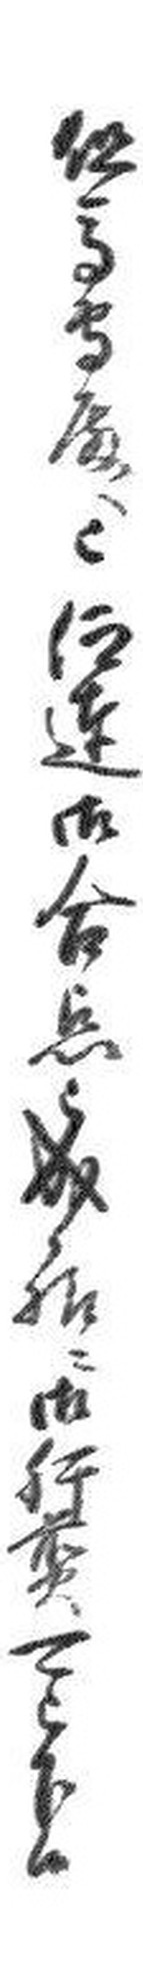但馬守殿へ被仰達御合点被成候様ニ御肝煎可被下候
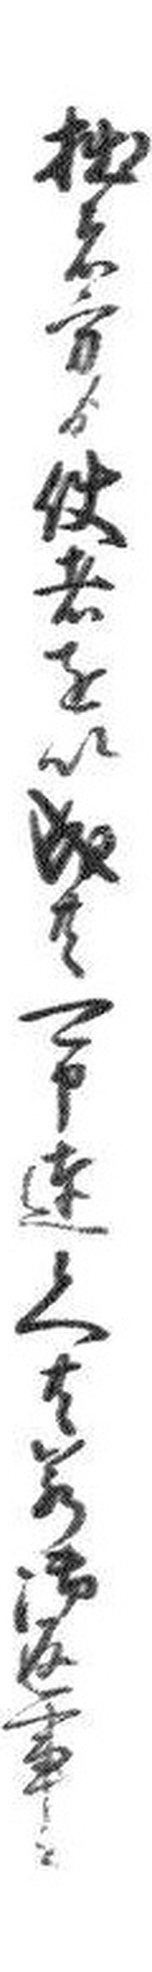拙者方ゟ使者を以成共可申達候ヘ共若御返事を
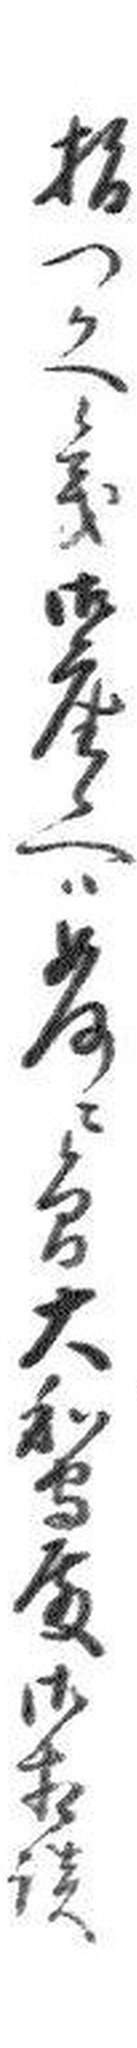指つかへ候義御座候へㇵ如何ニ候間大和守殿御相談
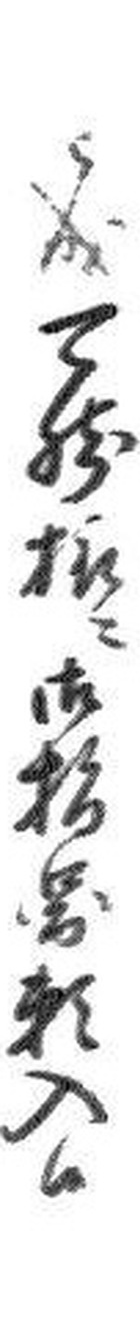被成可然様ニ御指図頼入候
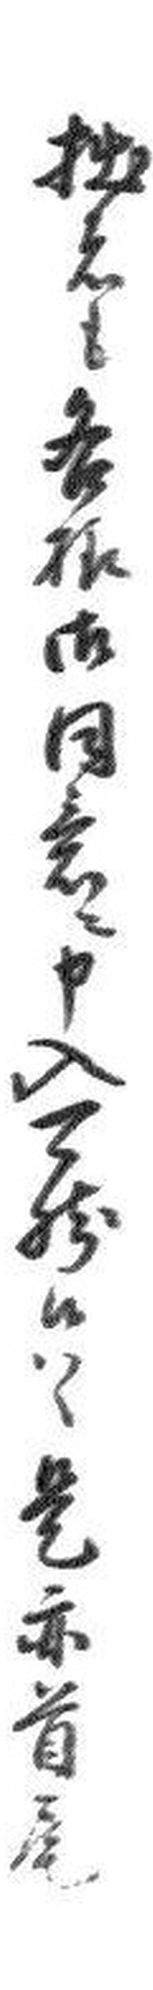拙者も各様御同意ニ申入可然候ㇵゝ是亦首尾
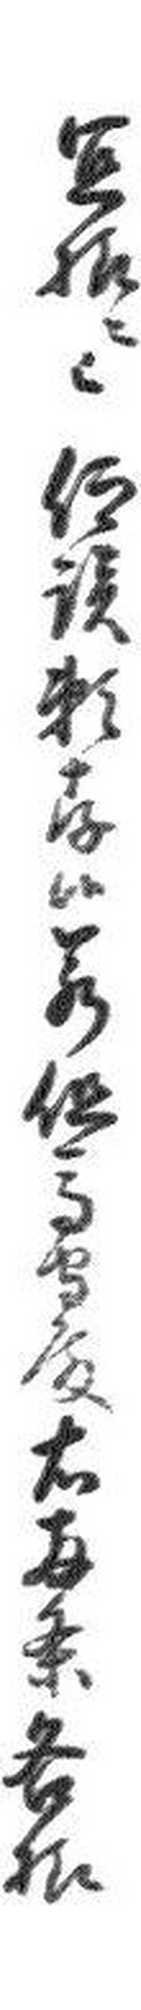宜様ニ被仰談頼存候若但馬守殿右両条各様
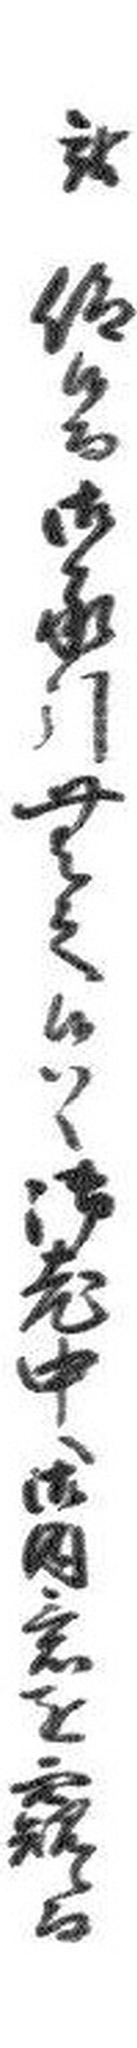被仰候而御承引無之候ハゝ御老中ヘ御内意を窺候而
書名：家譜 十一 昌親公 従延宝二年到延宝四年八月
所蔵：福井県文書館 Fukui Prefectural Archives
